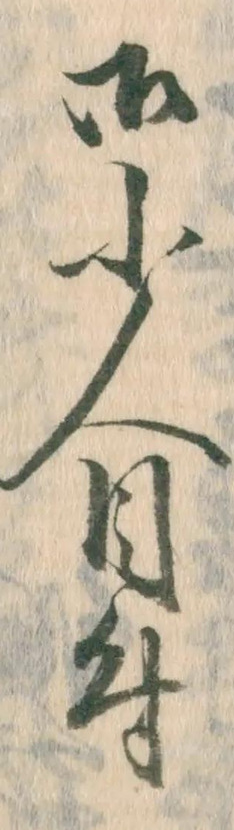御小人目付

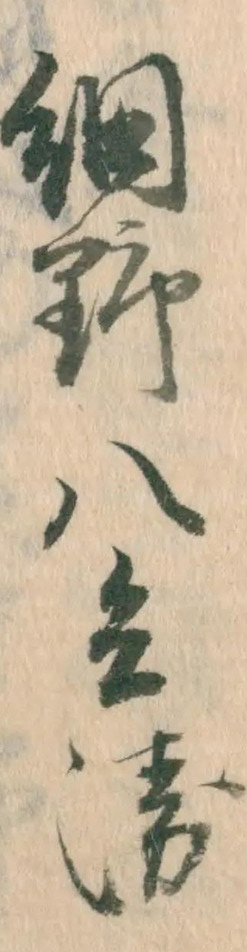網野八兵衛
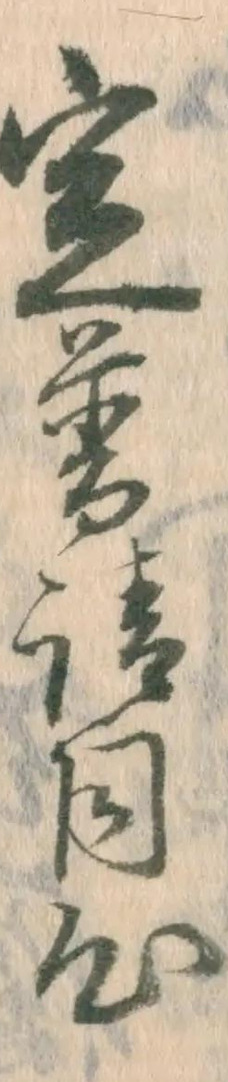定普請同心
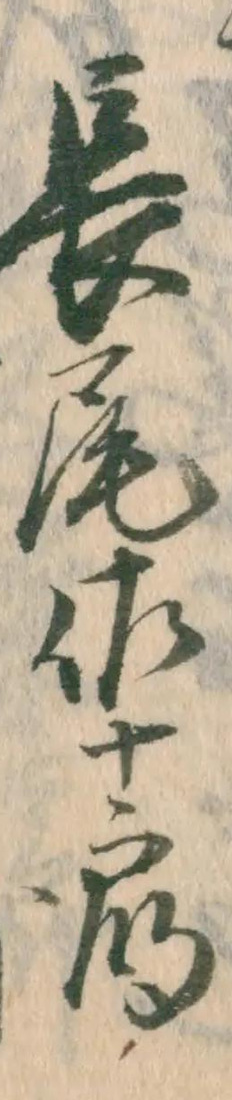長尾佐十郎
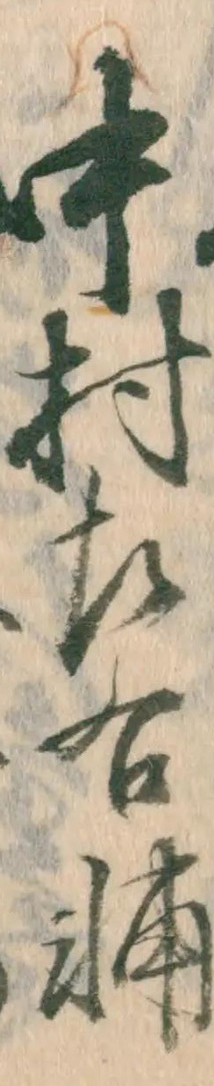中村左右輔
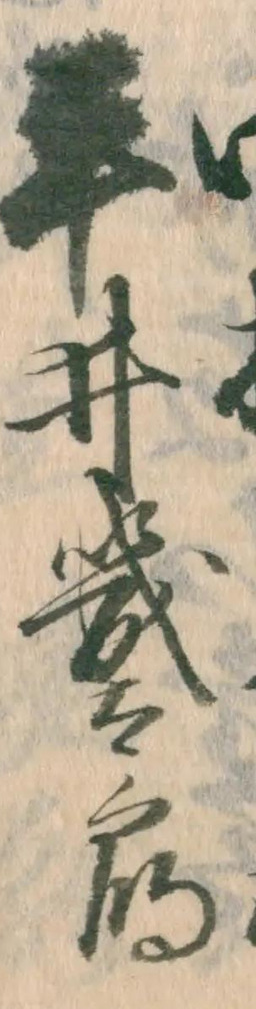平井幾太郎
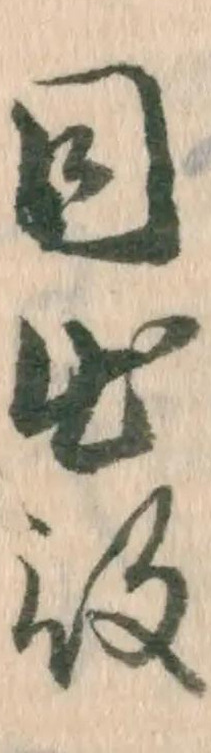同出役
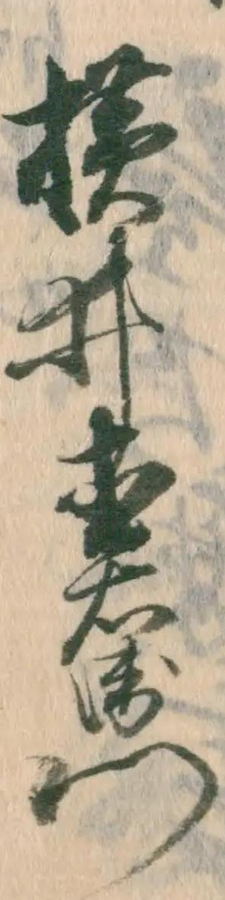横井直右衛門
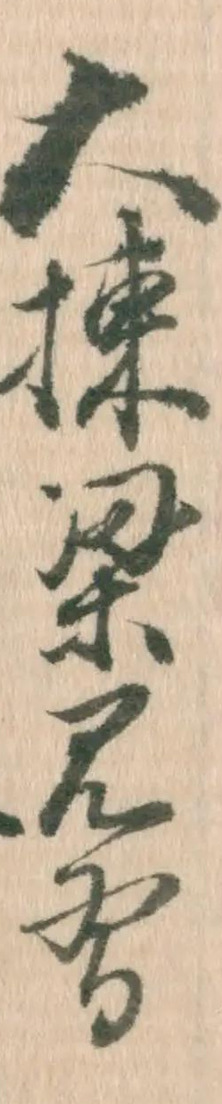大棟梁見習
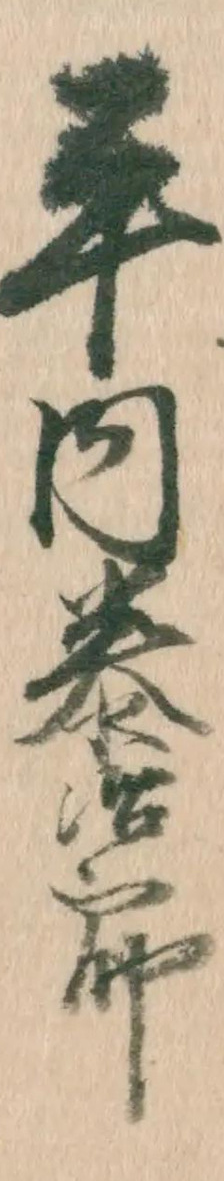平内泰治郎
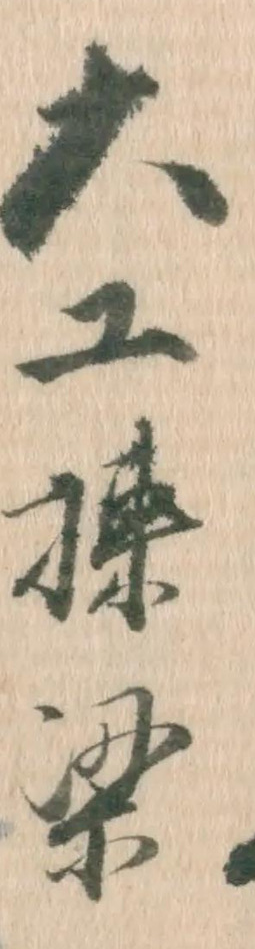大工棟梁
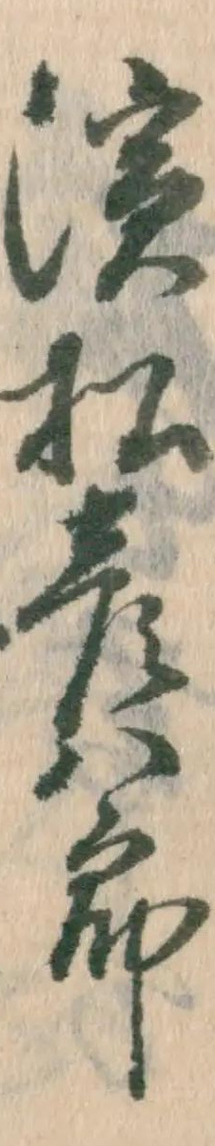浜松彦八郎
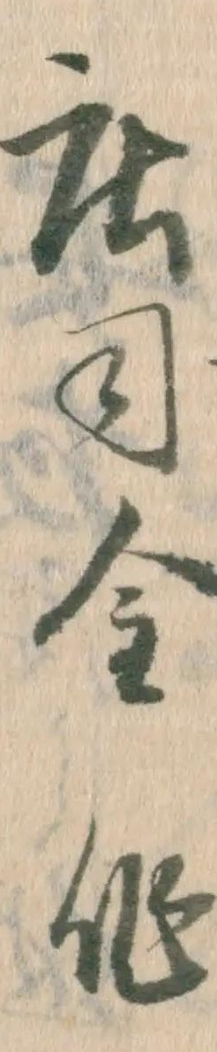庄司金作
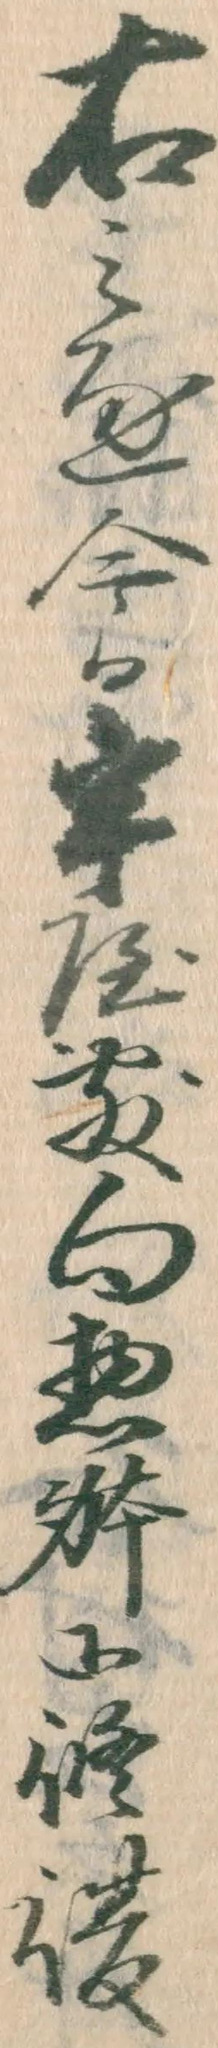右之通今日牢屋敷向惣体御修復
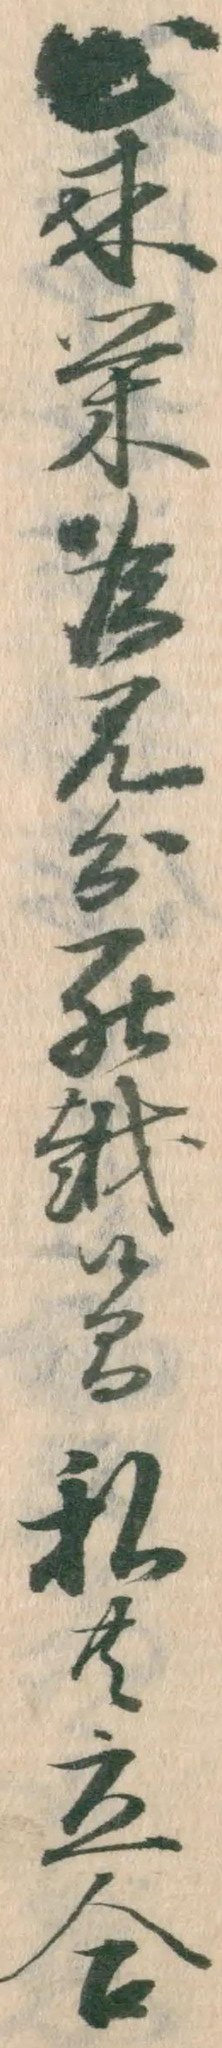出来栄為見分罷越候間私共立合

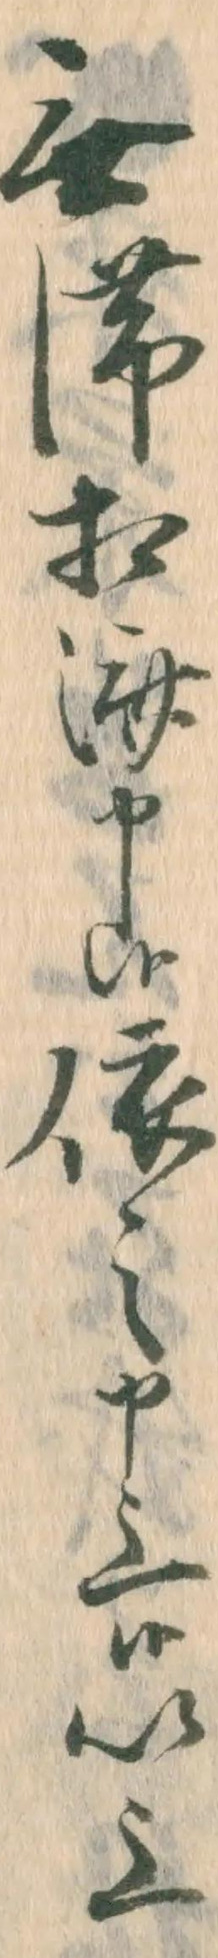無滞相済申候依之申上候以上
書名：七十冊物類集 71巻. [44] 四十三 牢屋敷御普請御修覆地震ニ付骨折候牢屋掛御褒美之部
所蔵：国立国会図書館 National Diet Library, JAPAN
